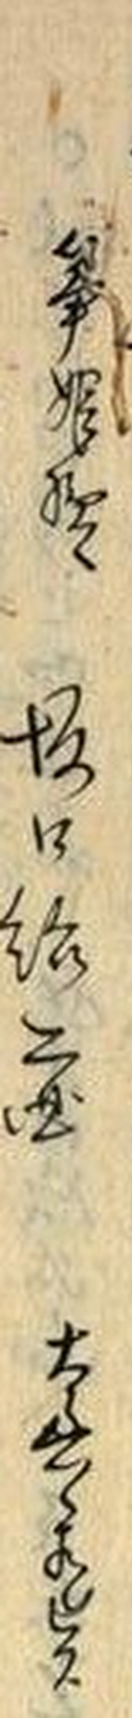箏姫様へ坂口飴二曲大奥へ相廻ス
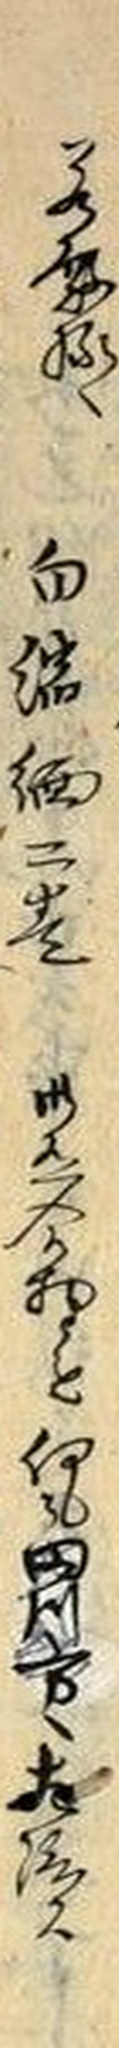若殿様へ白縮緬二巻御有合物被進何も田川方へ相渡ス
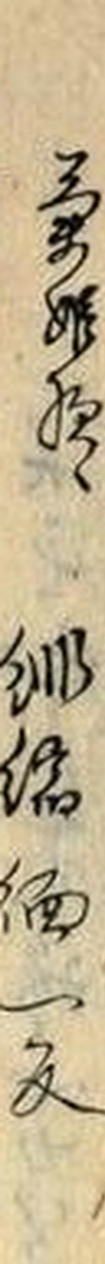菊姫様へ緋縮緬一反
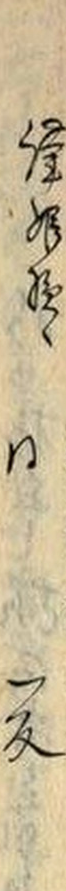謹姫様へ同一反
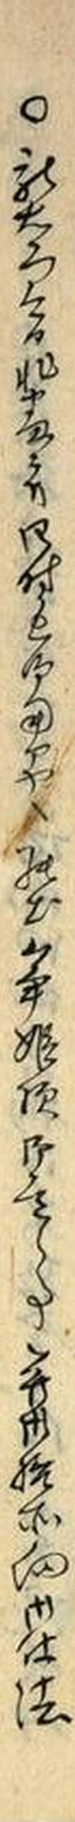〇新右衛門今日非番ニ而四時過御用部ヤへ罷出箏姫様御意之候事并御膳所向御仕法
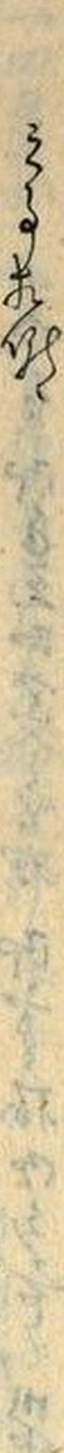之事相噺候
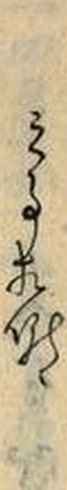之事相噺候
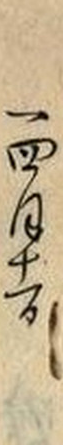一四月十日
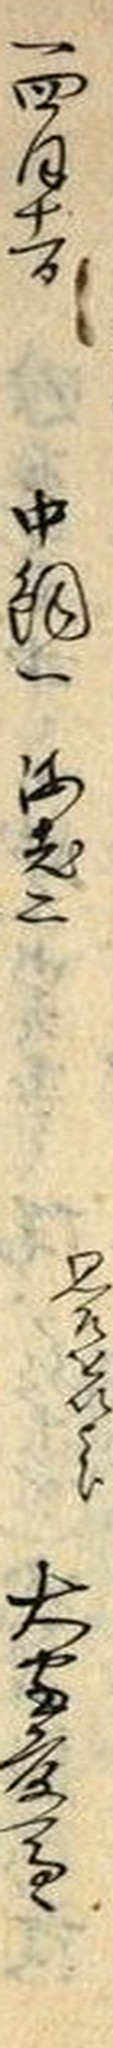一四月十一日中鯛一海老二思召を以被下大宮藤馬
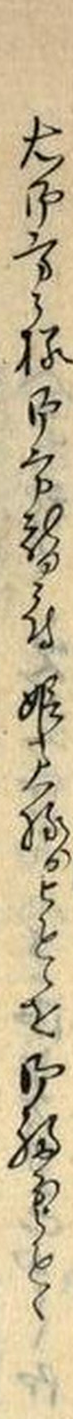右御方々様御方替ニ付姫君様ゟ被進候を御福分被進候
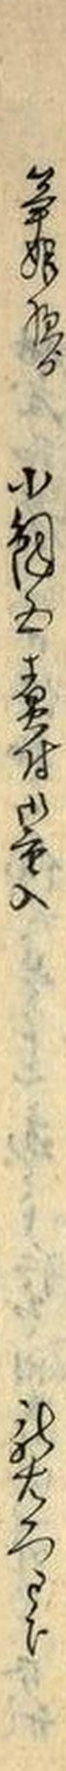箏姫様ゟ小鯛五煮付御重入新右衛門へ被下
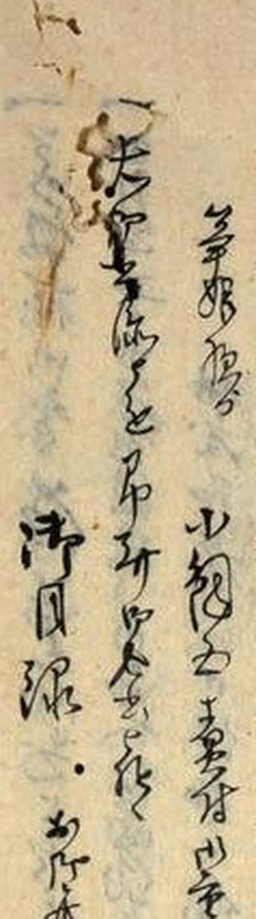右御書添被進即刻御返書被遊候
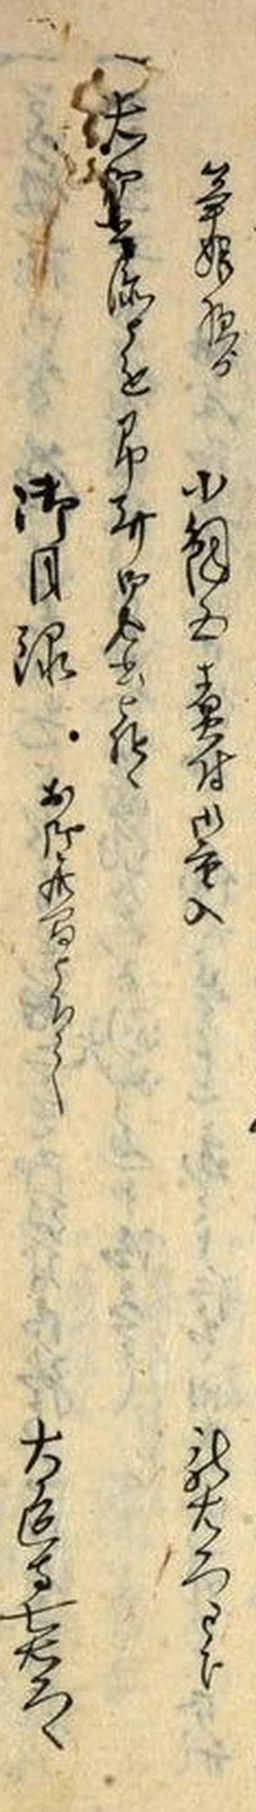右御書添被進即刻御返書被遊候
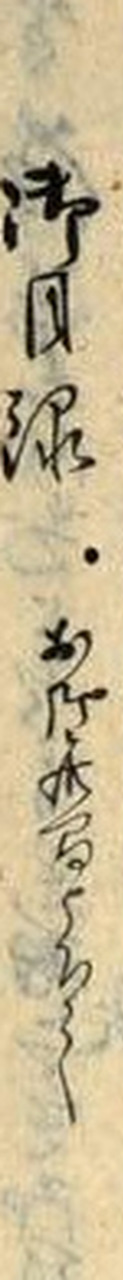御目録於御居間被下之

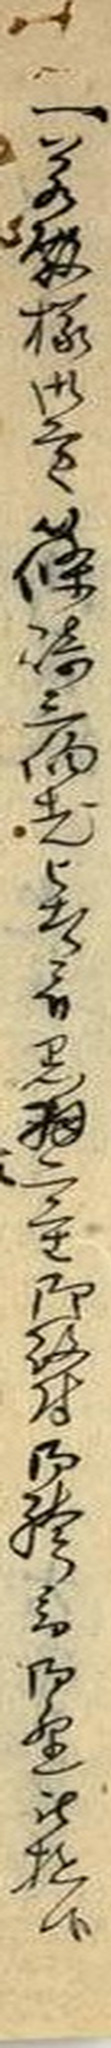一若殿様御方へ篠崎三伯老被出候ニ付黒羽二重御紋付御袴ニ而御逢被遊候
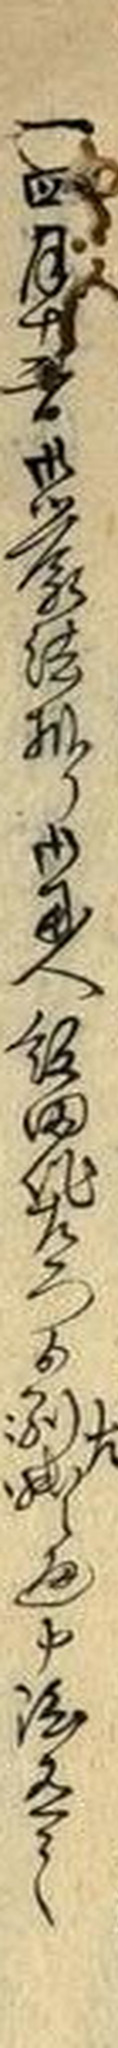一四月十二日御厳法掛り御用人飯田作左衛門ゟ別紙左之通申渡有之
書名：少傅日録抄（斉承付側向頭取日記、在府）
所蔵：福井県文書館 Fukui Prefectural Archives
